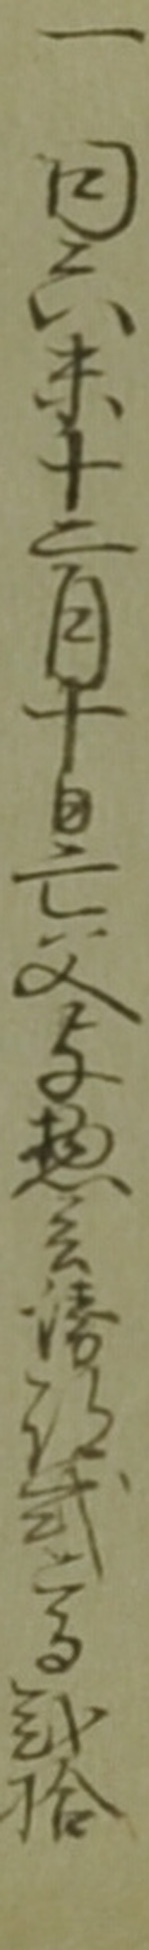一同六未十二月十日亡父与惣兵衛跡式高弐拾
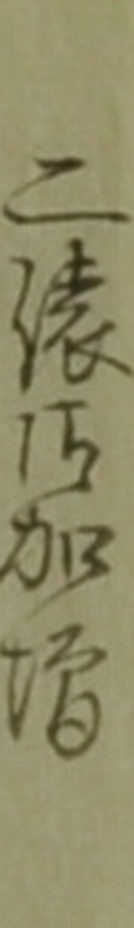二俵御加増
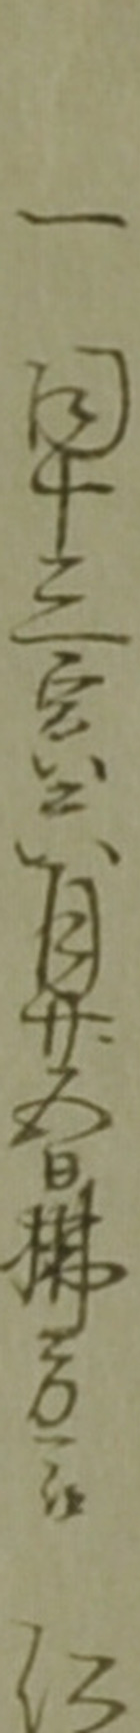一同十三寅六月廿五日払方被仰付
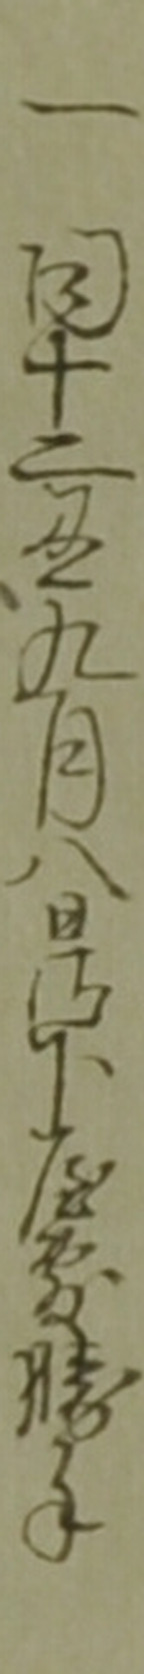一同十二丑九月八日御下屋敷勝手
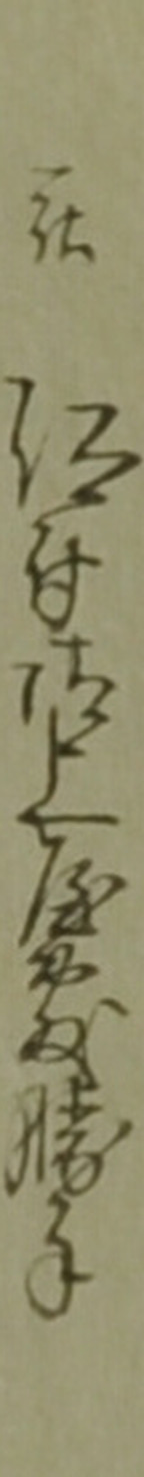被仰付御上屋敷勝手
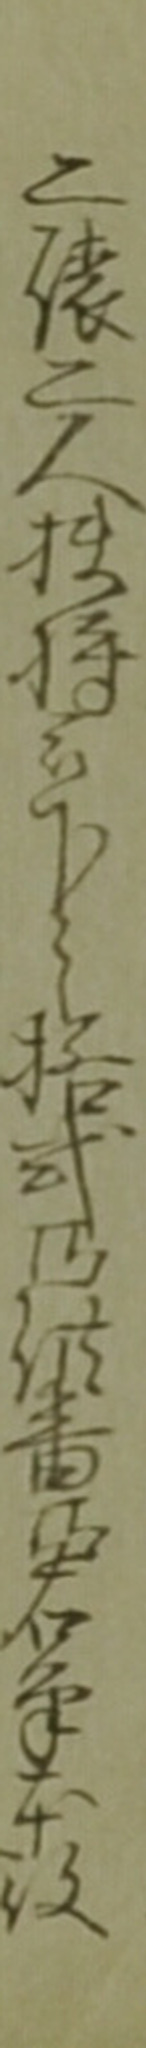二俵二人扶持被下之格式御供番御右筆本役
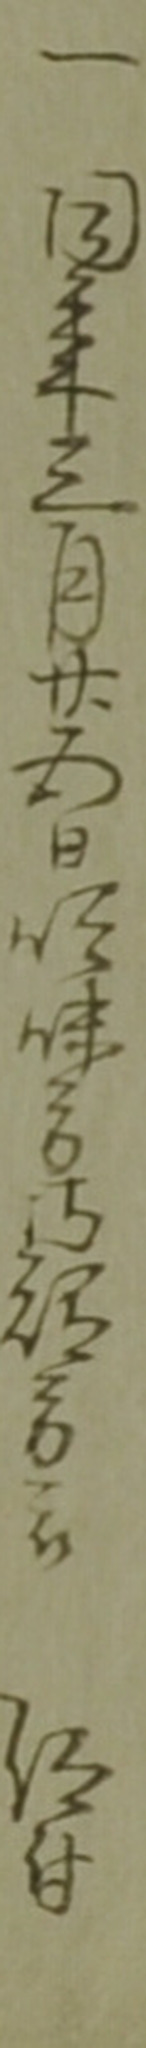一同年三月廿五日吟味方御賄方被仰付
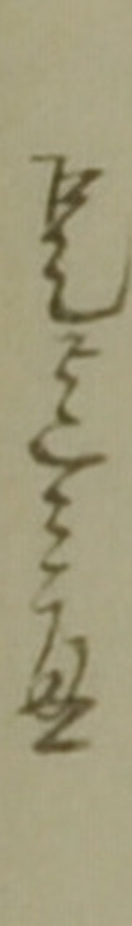是迄之通
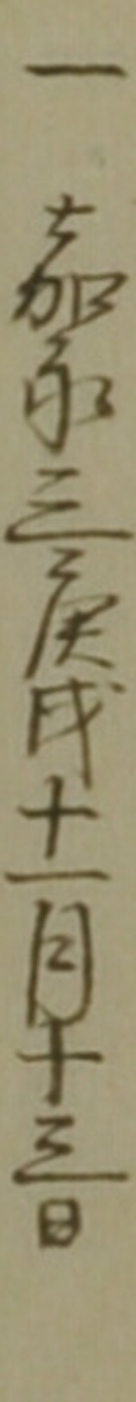一嘉永三庚戌十一月十三日
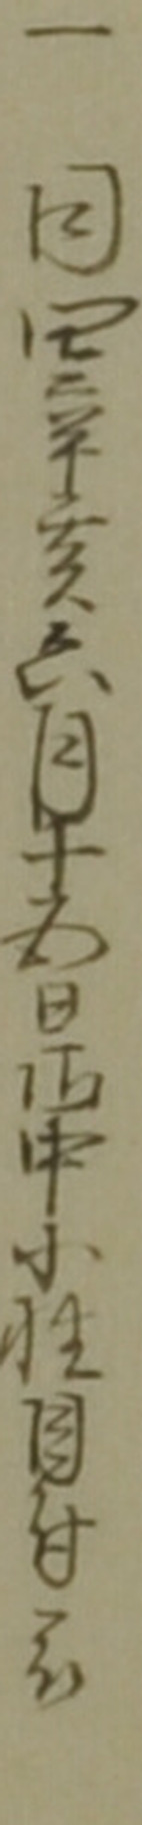一同四辛亥六月十五日御中小性目付被
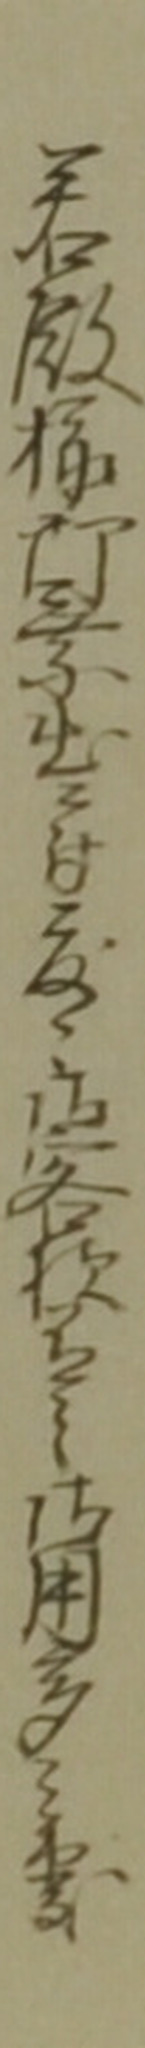若殿様御乗出ニ付度々御客様有之御用多之義
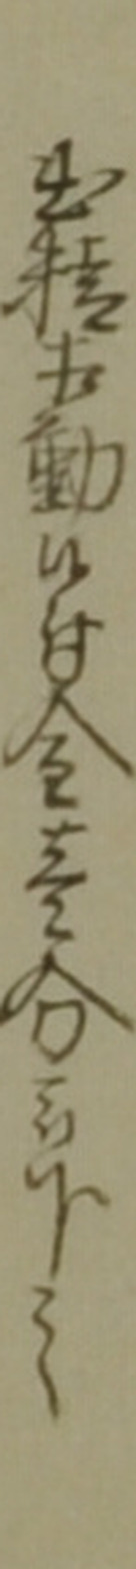出精相勤候付金壱分被下之
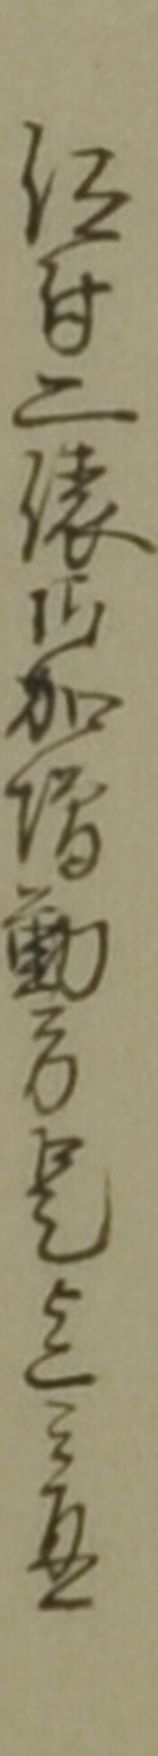仰付二俵御加増勤方是迄之通

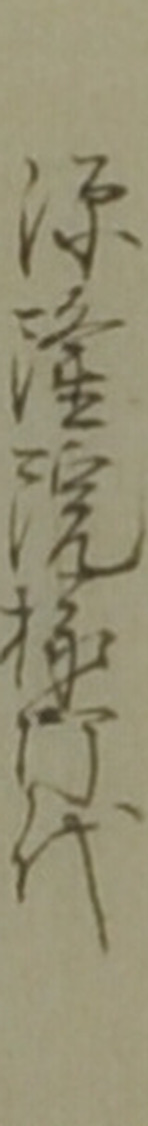源隆院様御代
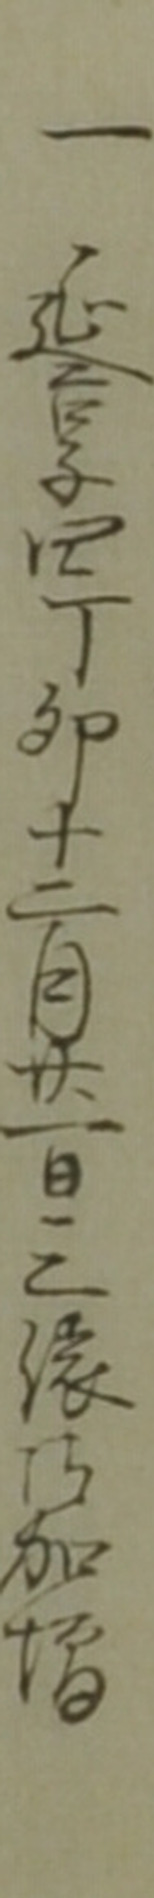一延享四丁卯十二月廿一日三俵御加増
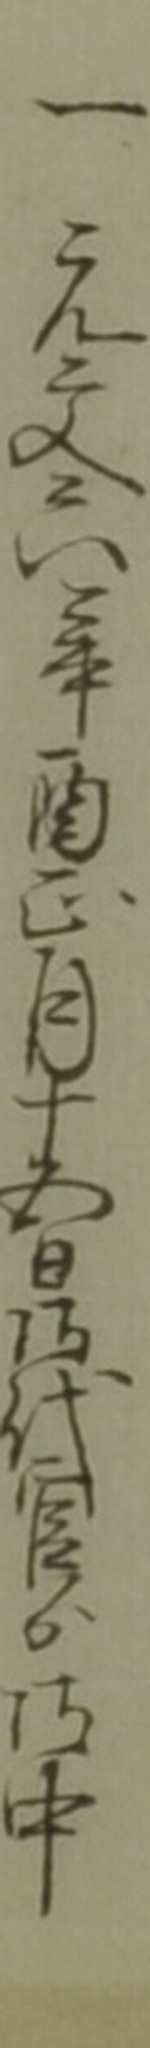一元文六辛酉正月十五日御代官ゟ御中
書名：無足諸士勤仕録（一）
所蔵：伊那市立高遠町図書館・合同会社AMANE
